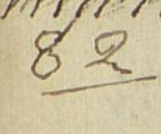82
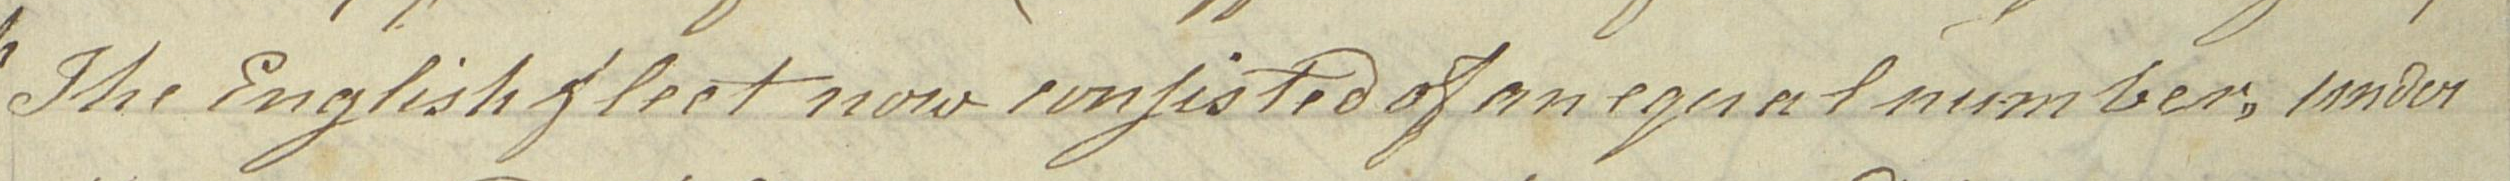The English fleet now consisted of an equal number, under
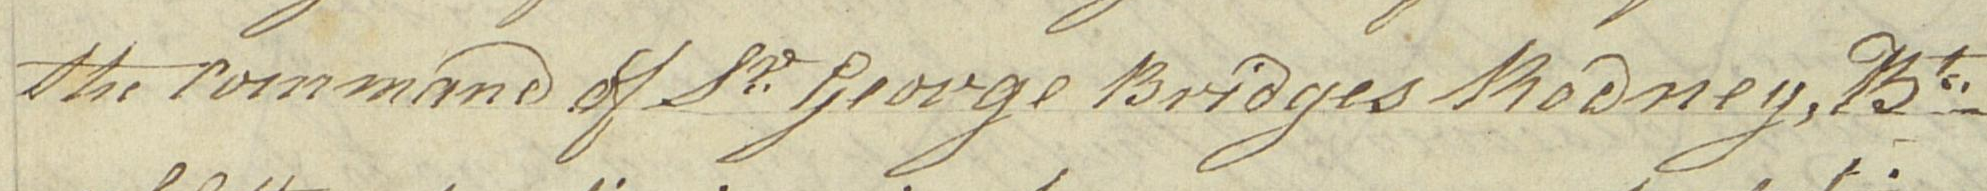the command of S^t. George Bridges Rodney, B^t
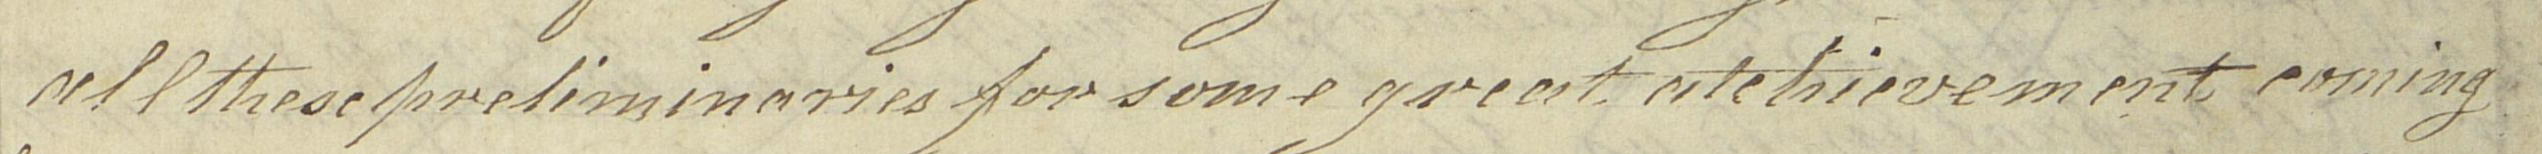all those preliminaries for some great atchievement coming
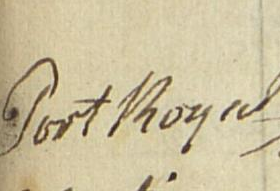Port Royal
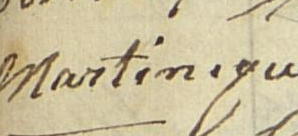Martinique
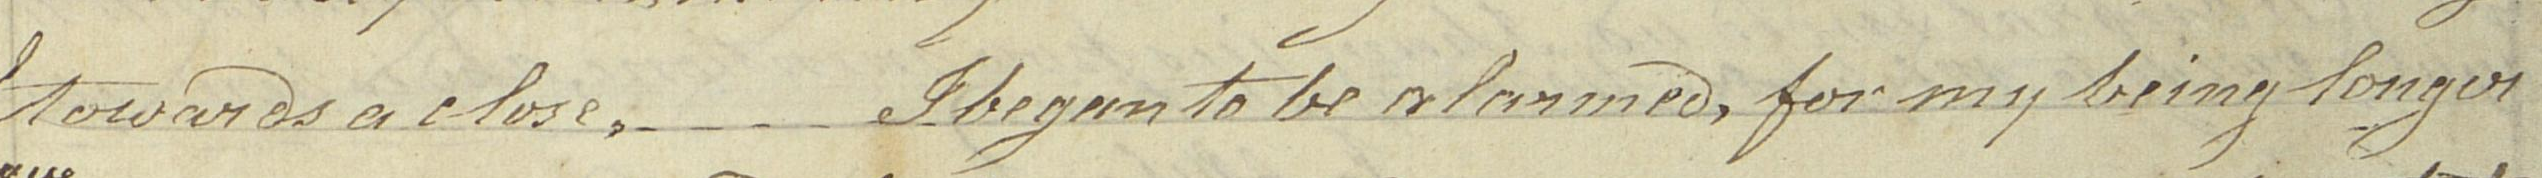towards a close. I began to be alarmed, for my being longer
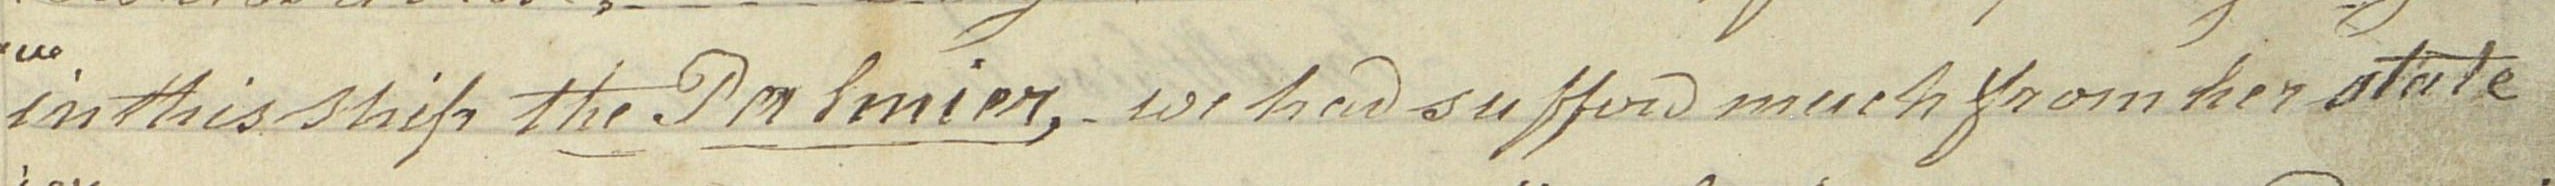in this ship the Palmier, we had sufferd much from her state
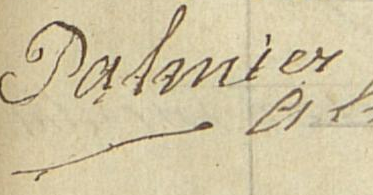Palmier
